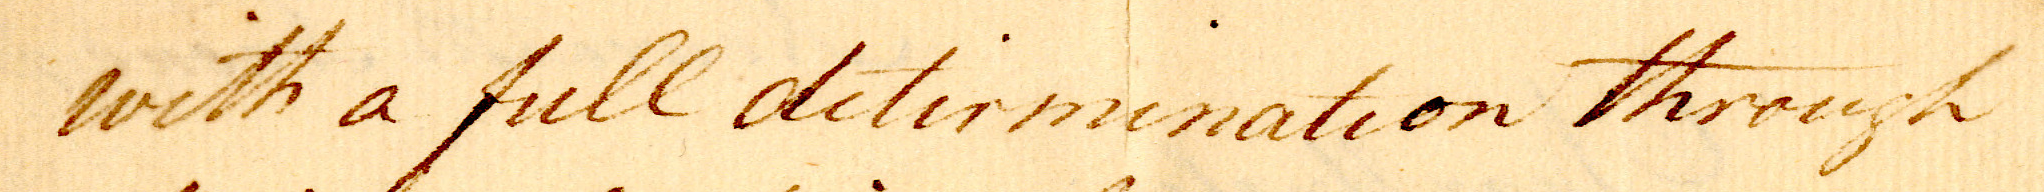with a full determination through
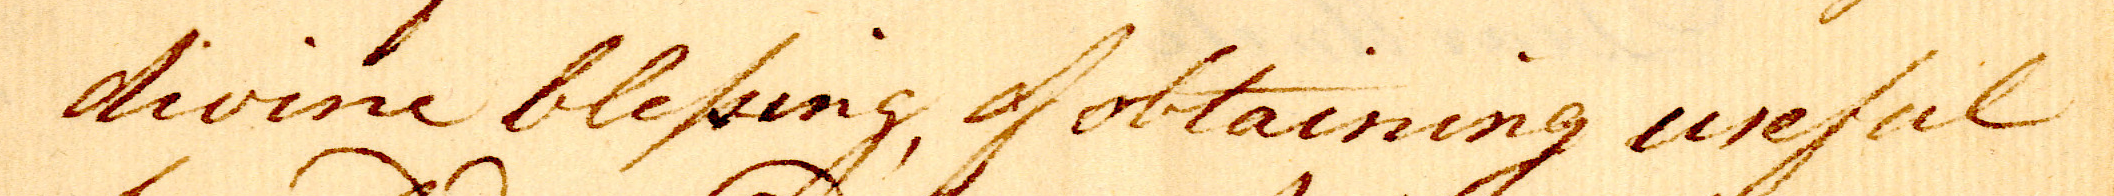divine blessing, of obtaining useful
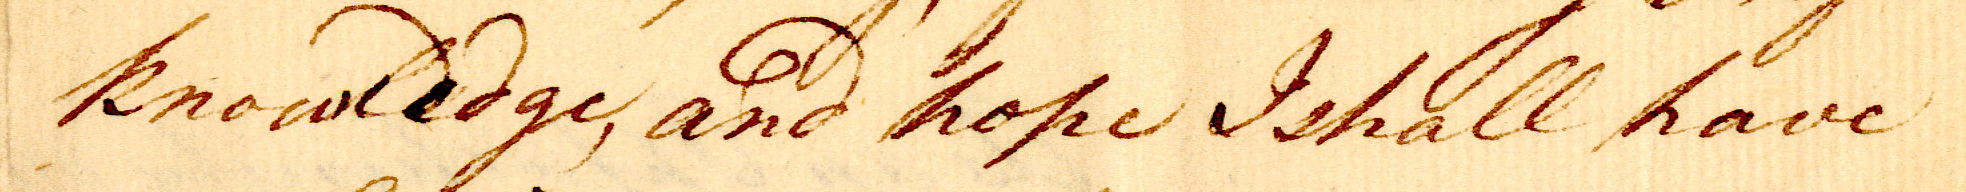knowledge, and hope I shall have
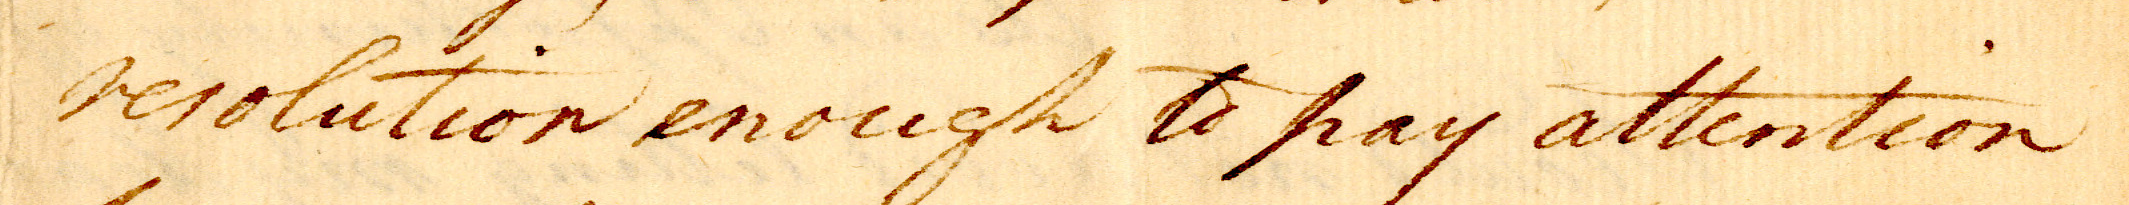resolution enough to pay attention
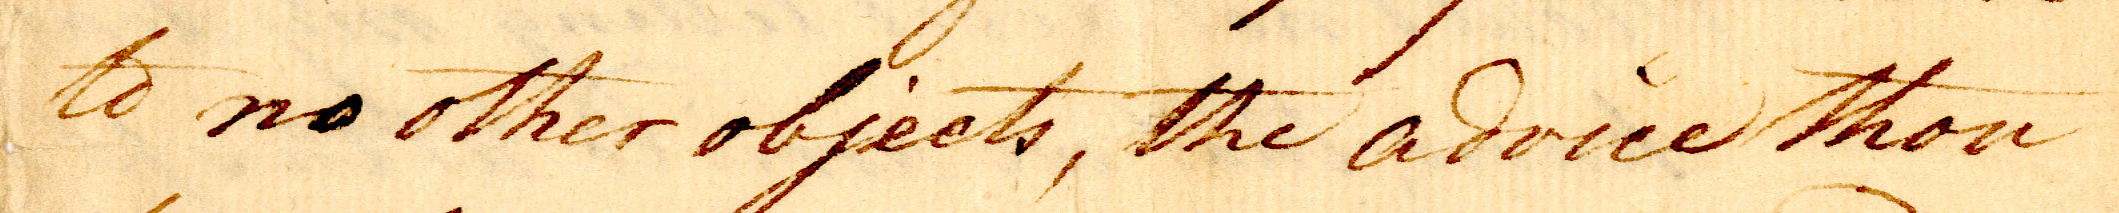to no other objects, the advice thou
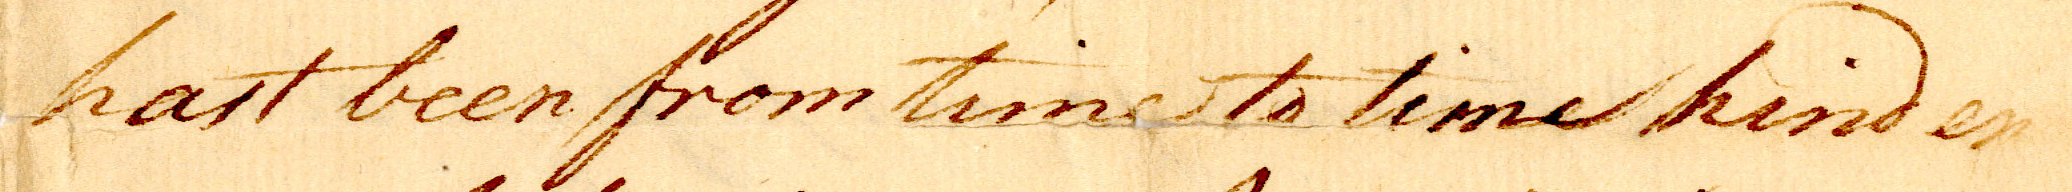hast been from time time time kind en
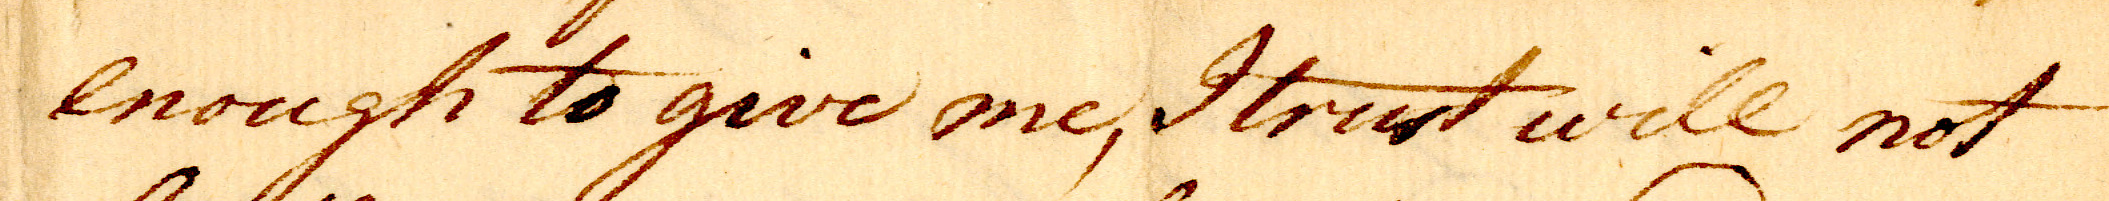enough to give one, I trust will not
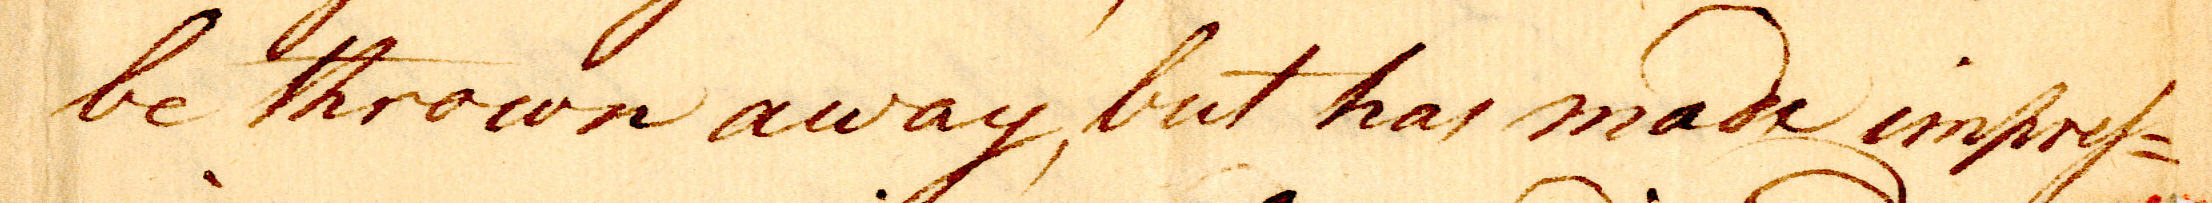be thrown away, but has made impres-
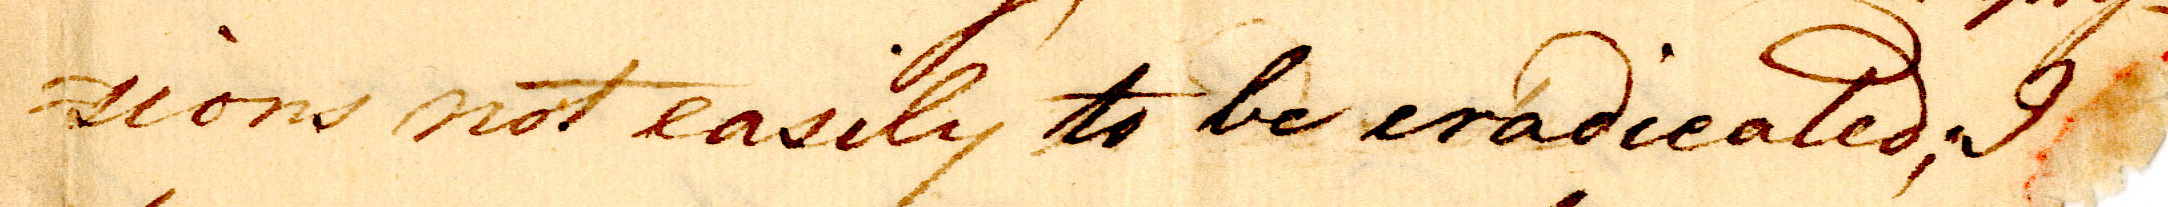-sions not easily to be eradicated, I
